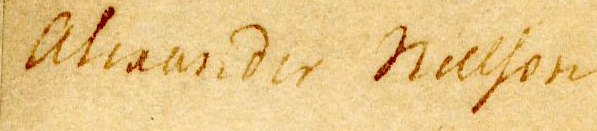Alexander Nelson
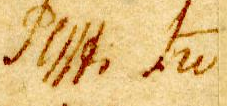Plll tre
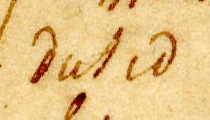duted
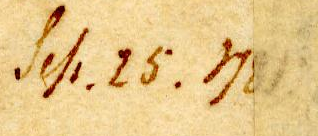Sep. 25. 1781.
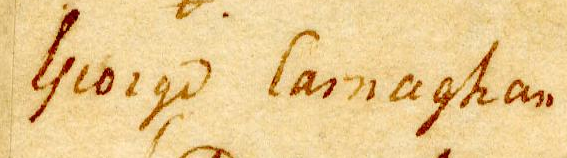George Carnaghan
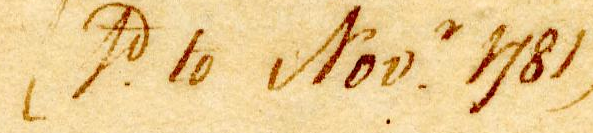s^d. to Nov. 1781)
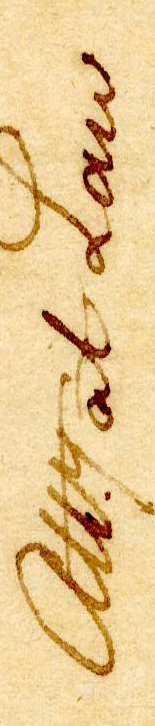Att^y. at Law
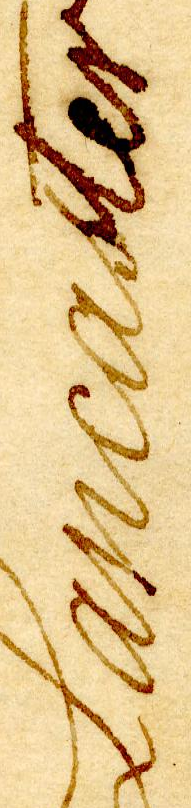Lancaster
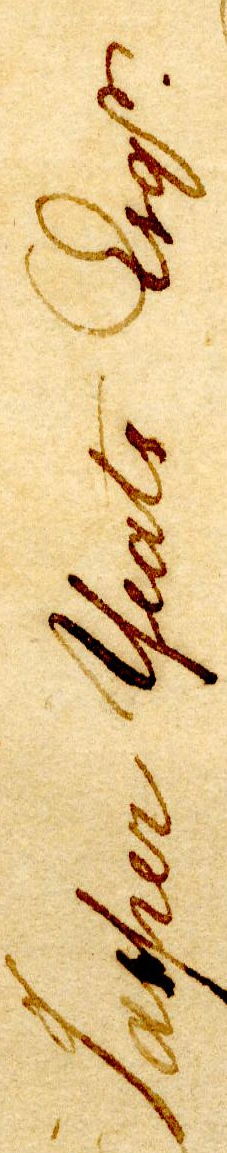Jasper Yeats Esq^r.
